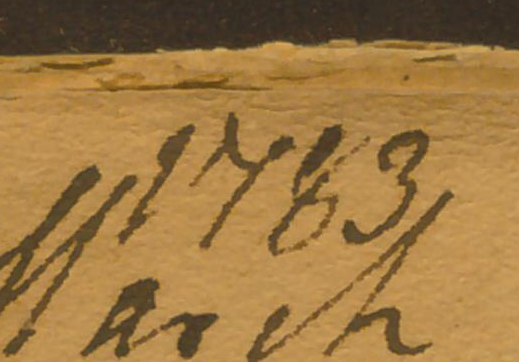1783
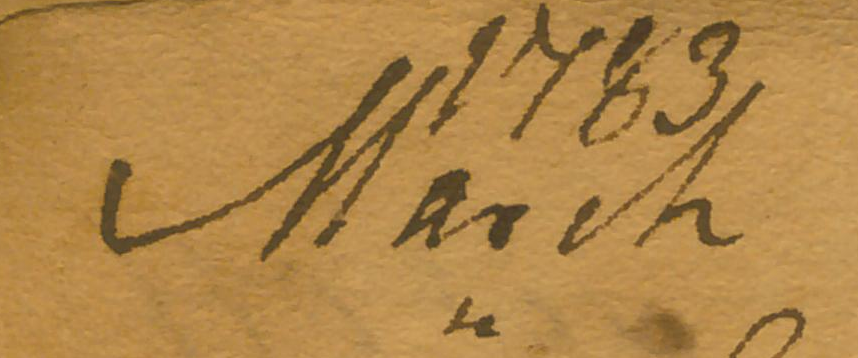March
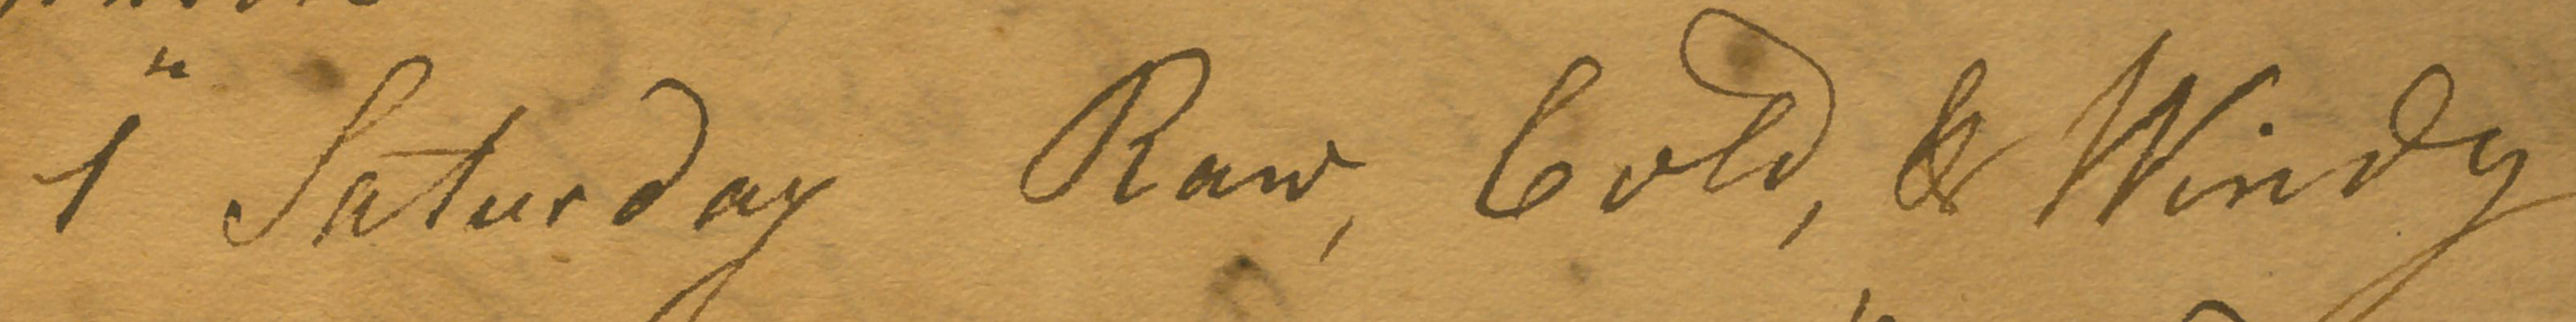1^th Saturday Raw, Cold, & Windy
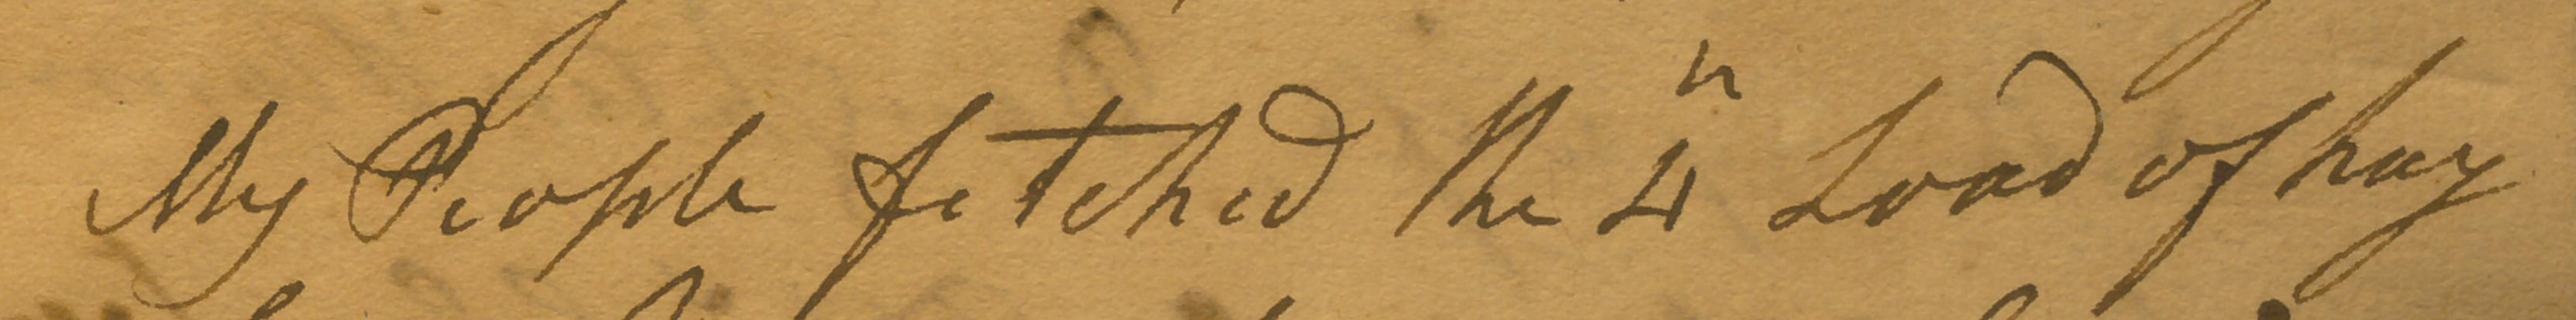My People fetched the 4^th Load of hay
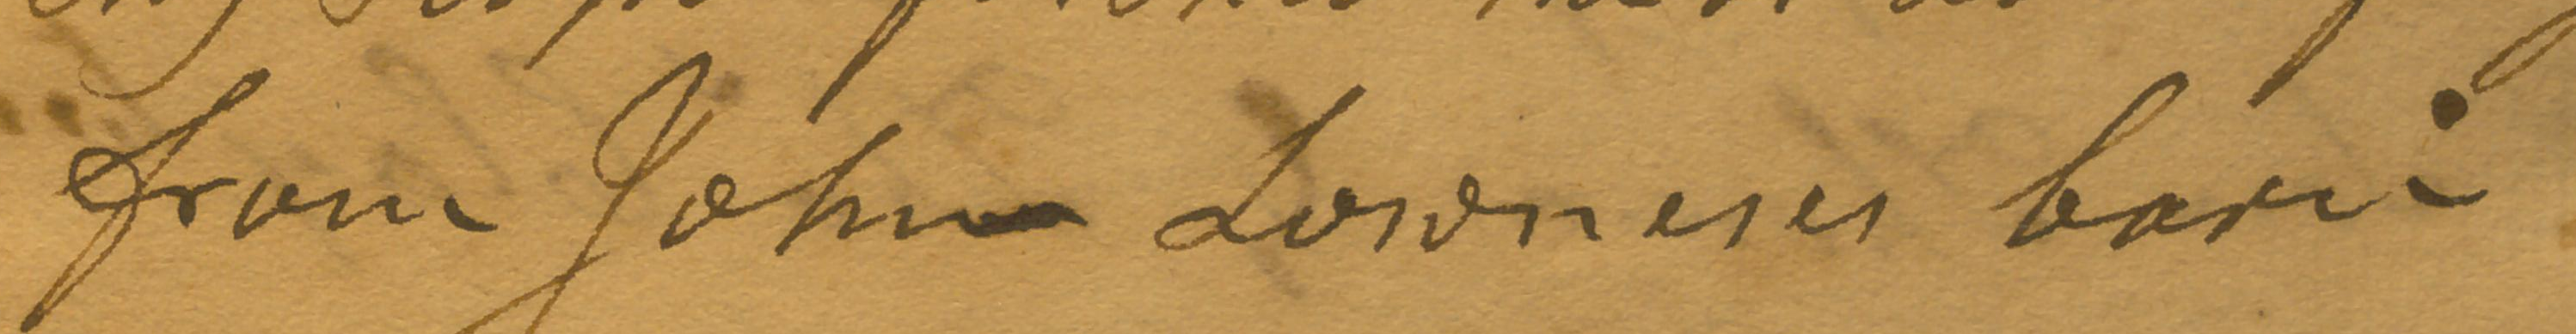fron John Lowneses barn
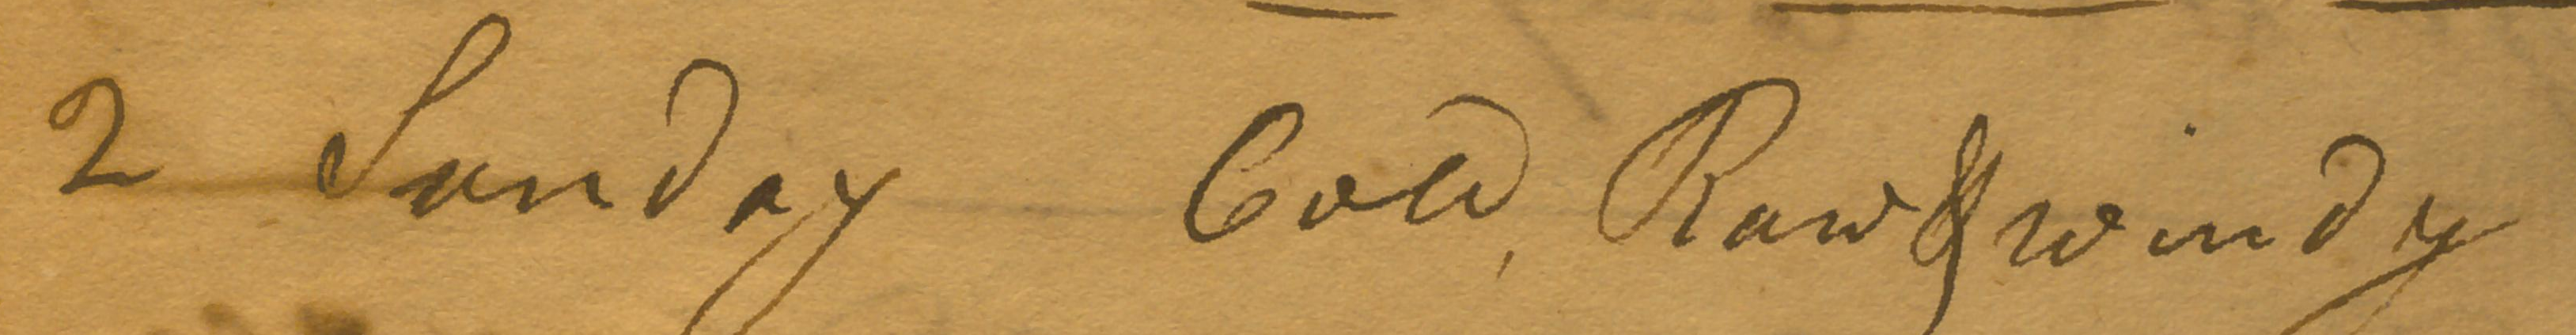2 Sunday Cold Raw & windy
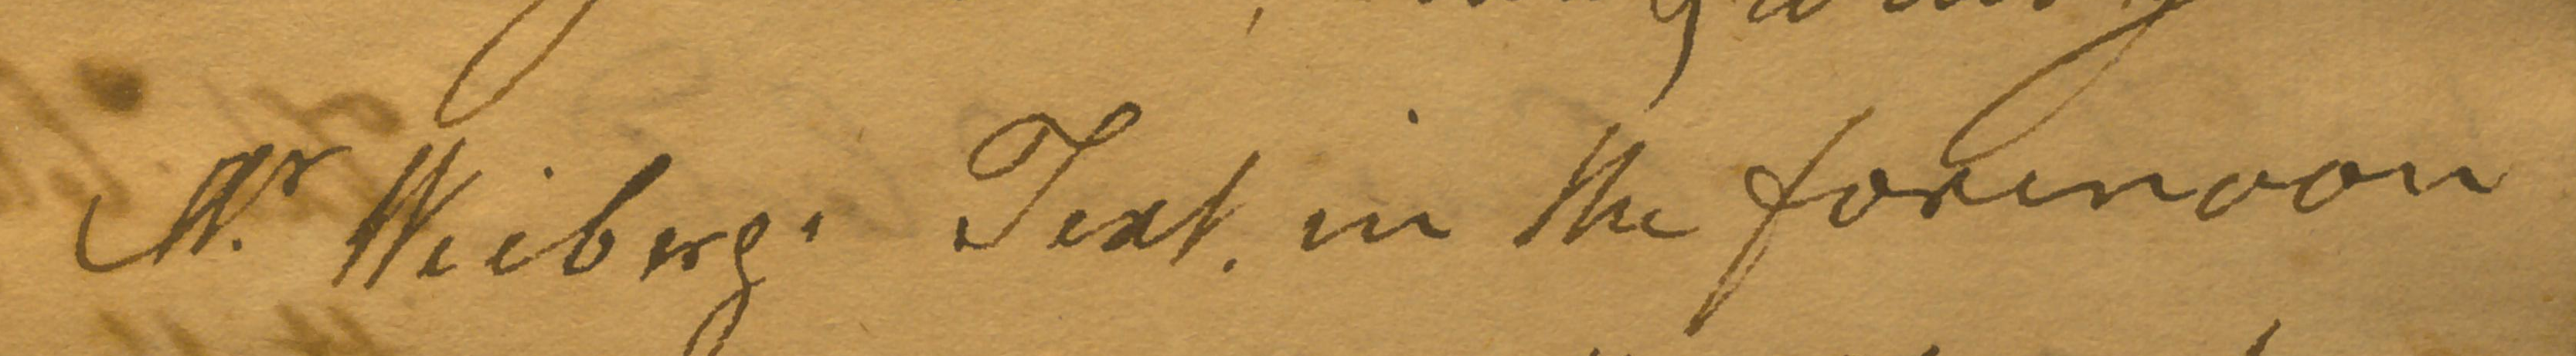M^r. Weibergs Text in the forenoon
